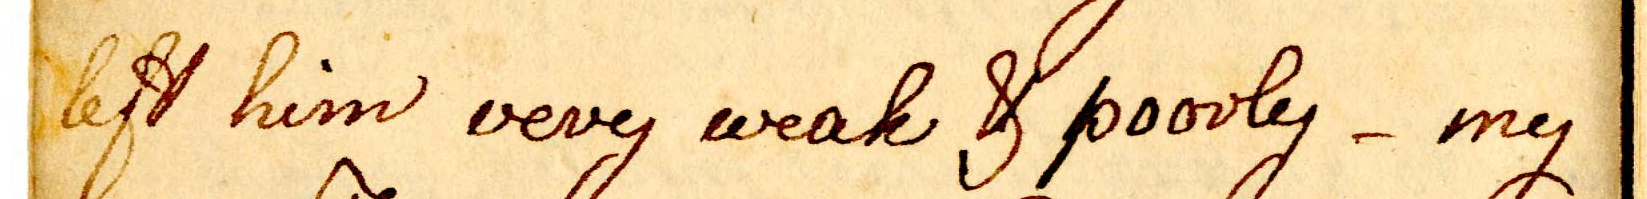left him very weak & poorly- my
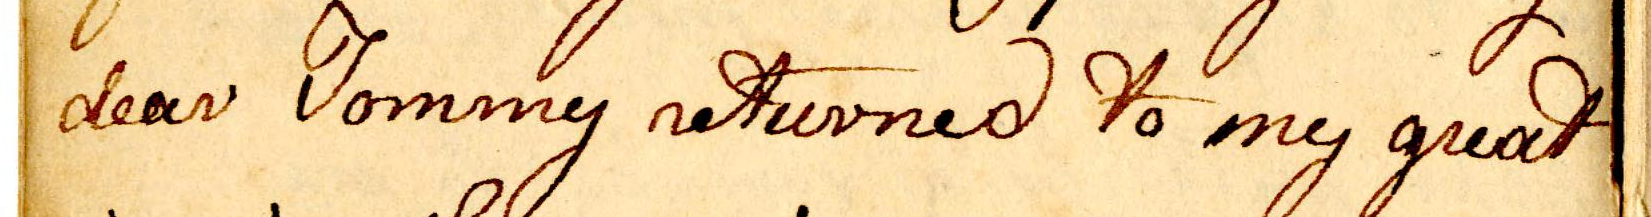dear Tommy returned to my great
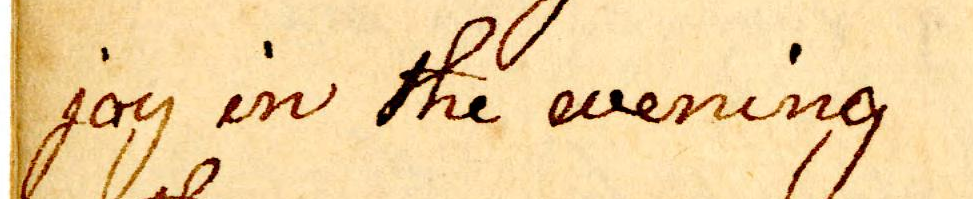joy in the evening
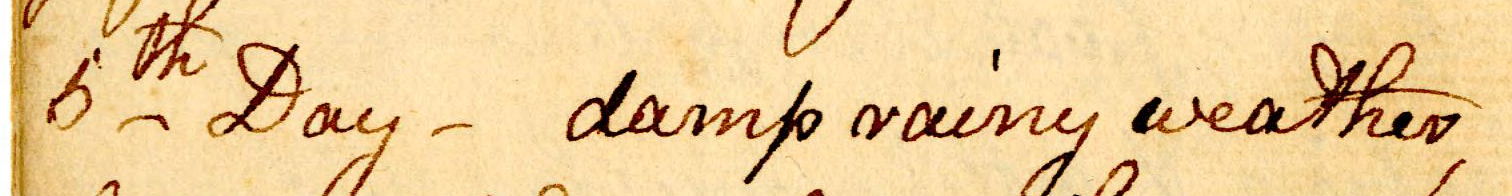5^th Day- damp rainy weather
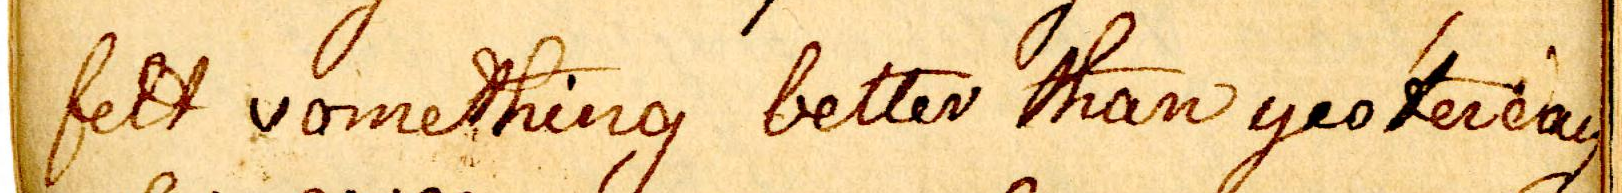felt something better than yesterday
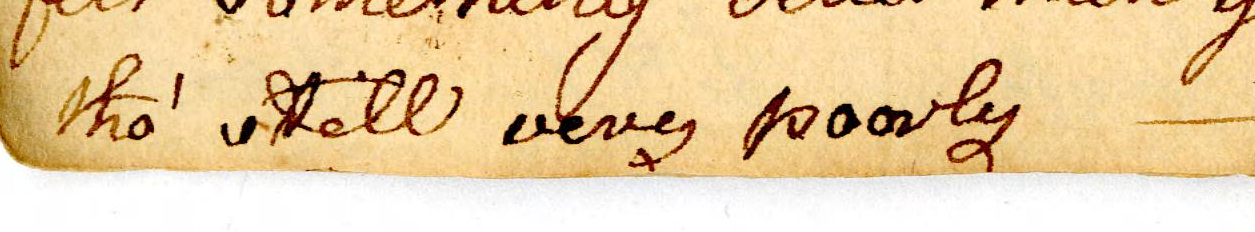tho' still very poorly
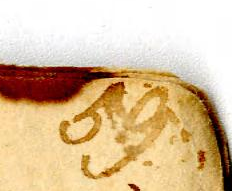59
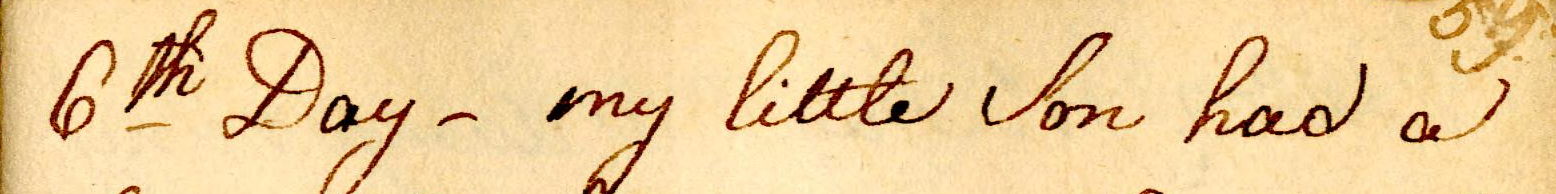6th Day- my little Son had a
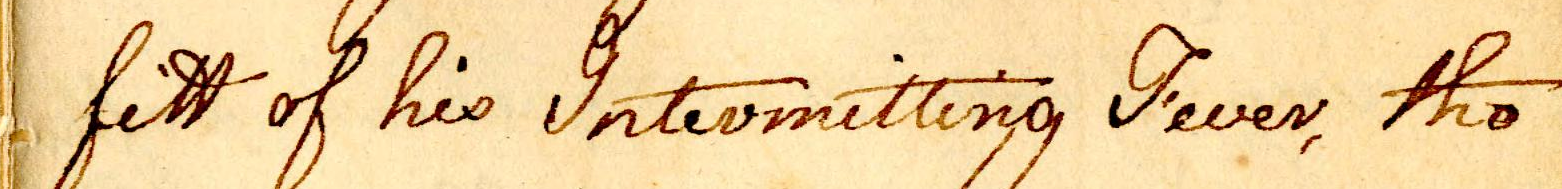fitt of his Intermitting Fever, tho
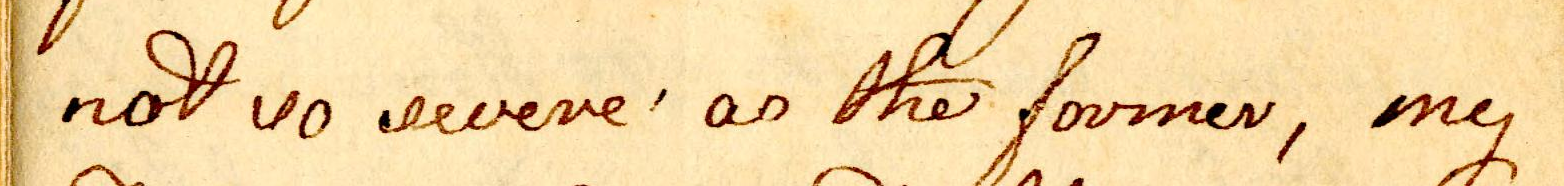not so severe as the former, my
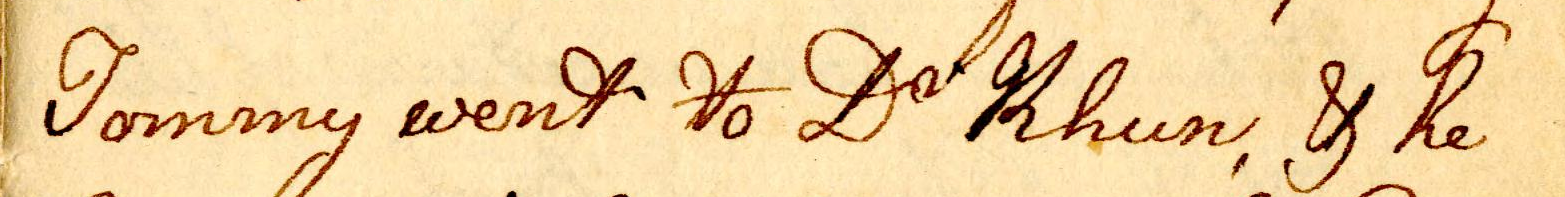Tommy went to D^r Khun, & he
